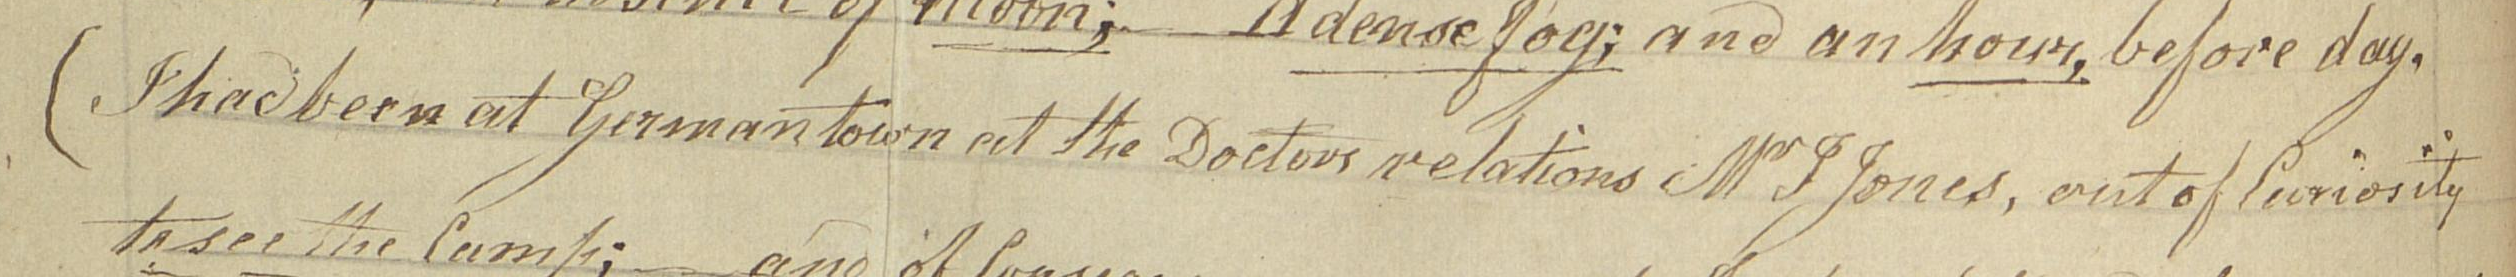(I had been at Germantown at the Doctors relationss M^rs Jones, out of Curiosity
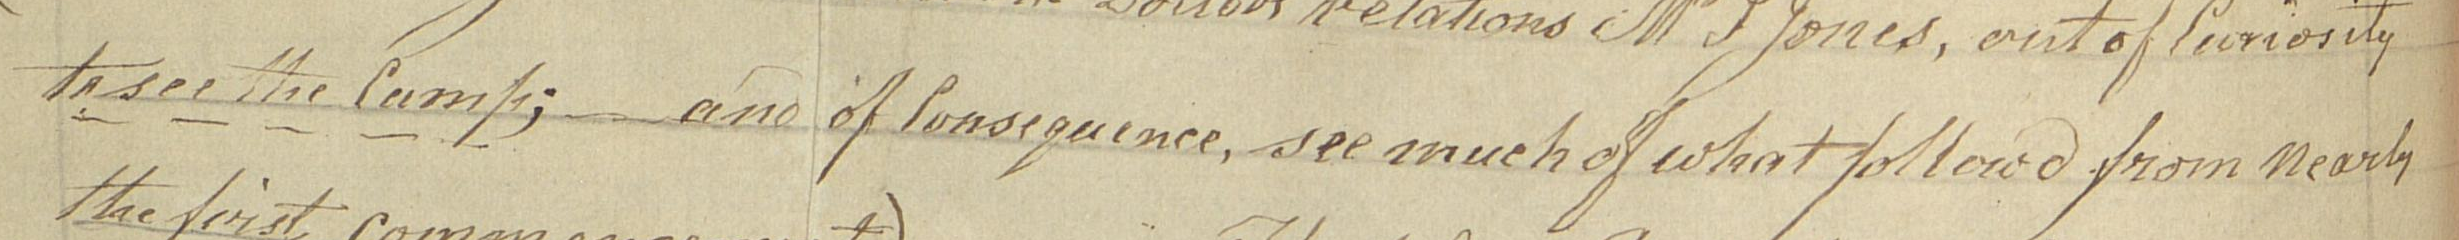to see the Camp; and of Consequence, see much of what followd from nearly
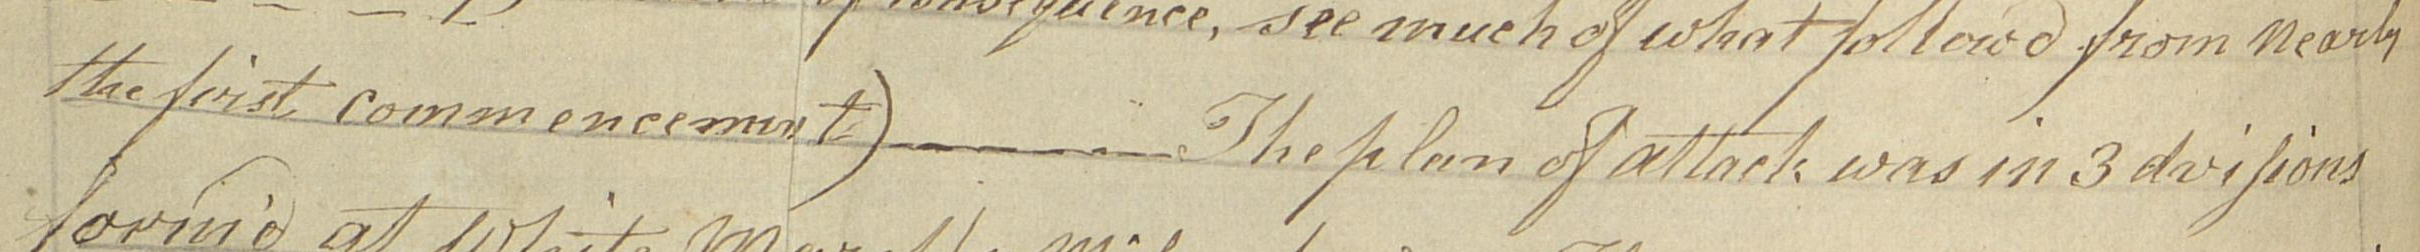the first commencement) The plan of attack was in 3 divisions
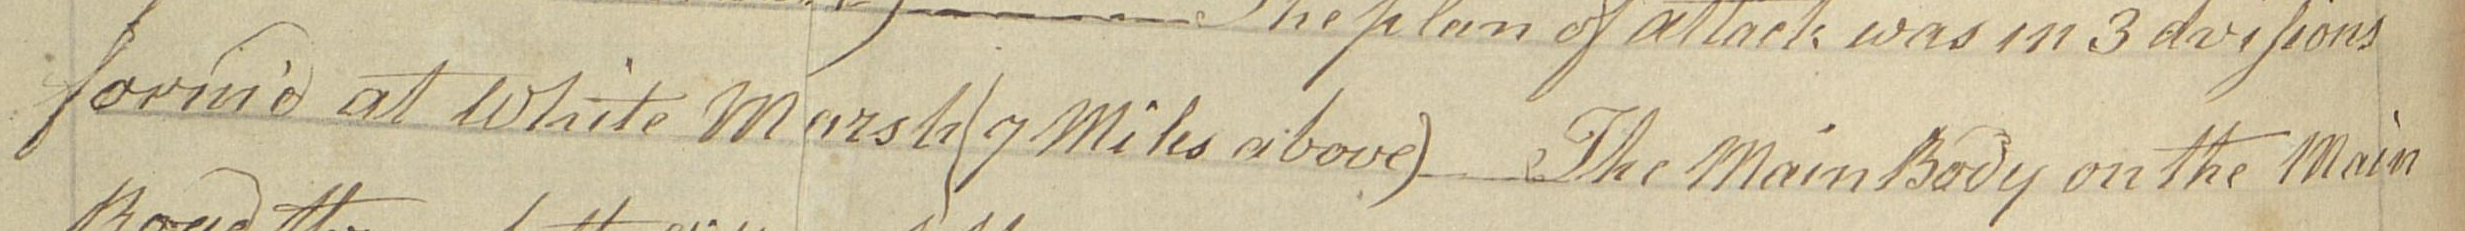form'd at white Marsh (7 Miles above) The Main Body on the Main
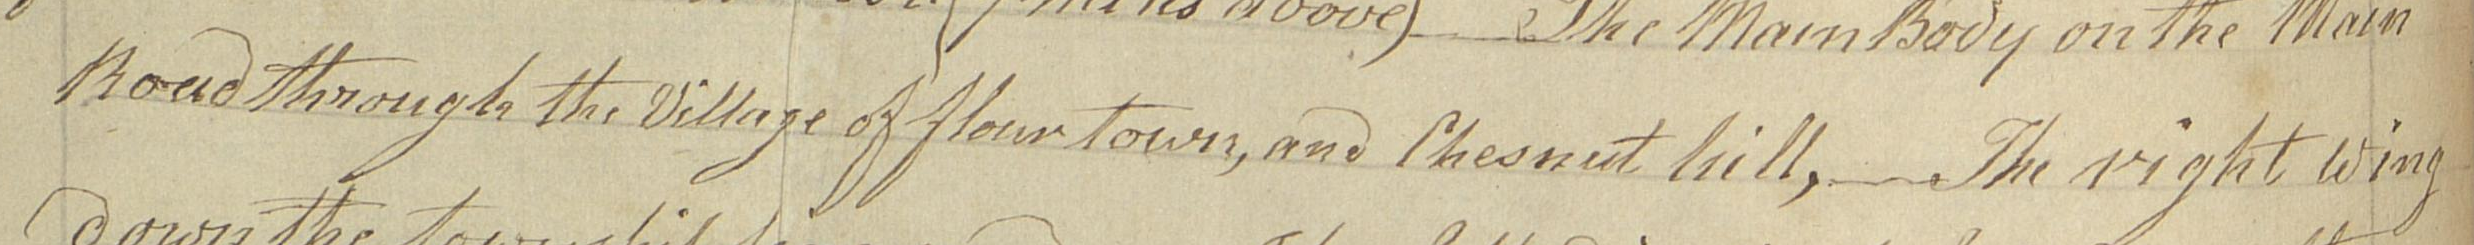Road through the Village of flourtown, and Chesnut hill, The right Wing
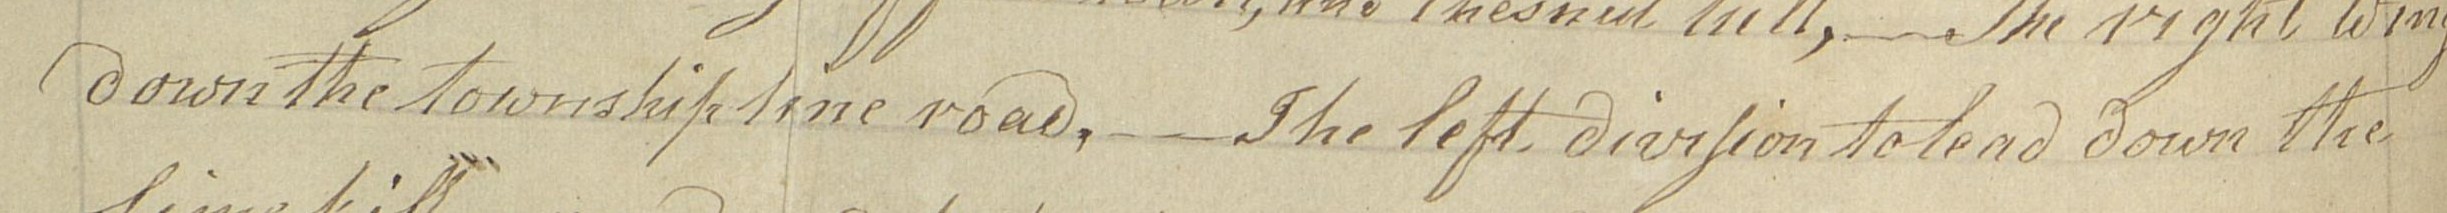down the township line road, The left division to lead down the
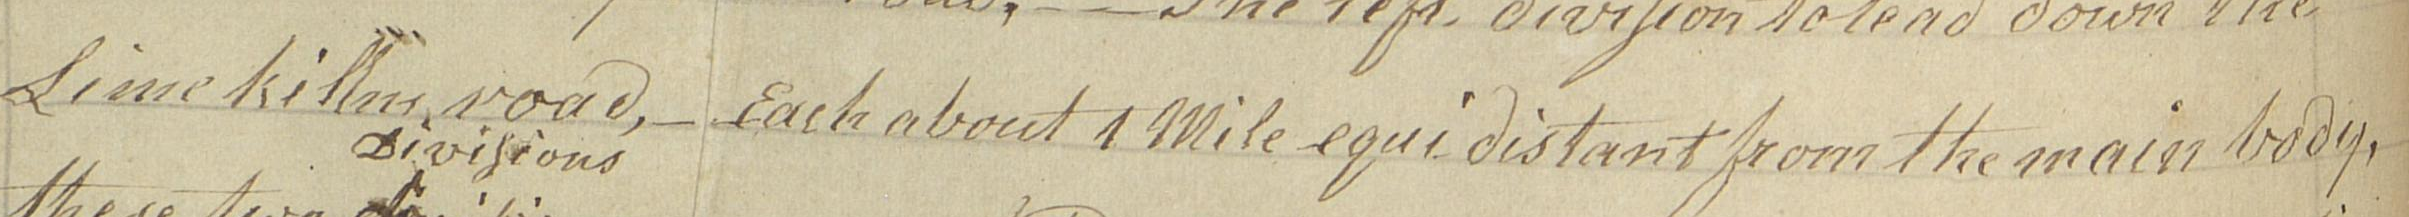Lime kilns road, Each about 1 Mile equidistant from the main body,
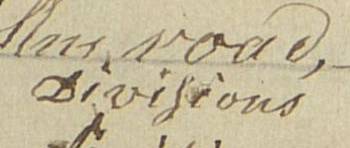Divisions
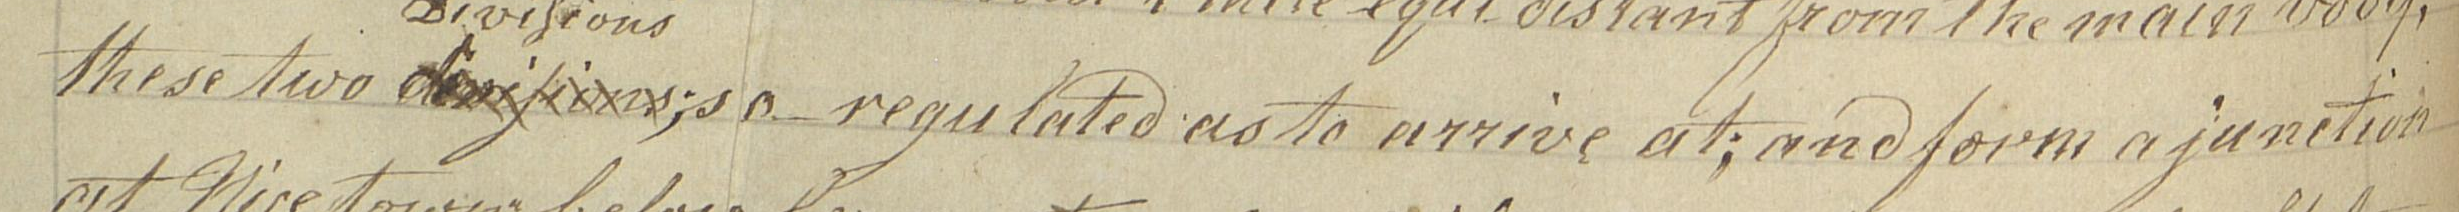these two divisions; so regulated as to arrive at; and form a junction
